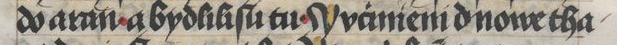do aran.a bydliliſu tu.Yvċiníeni dnowe tha¬
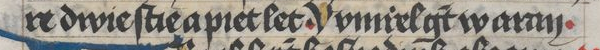re dwie ſtie a piet let.Y vmiel ḡt w aran.
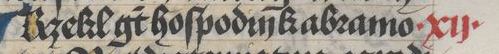.Rzekl ḡt hoſpodin abramo.xij.
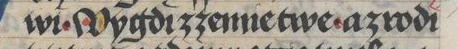wi.Wygdi z zemie twe.a zrodi¬
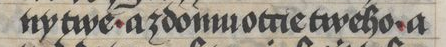ny twé.a zdomu otcie tweho.a
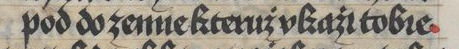pod do zemie kteruż vkażi tobie.
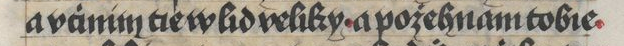a vċiním tie w lid veliky.a pożehnam tobie.
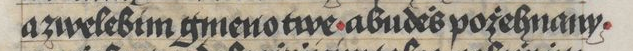a zwelebím gmeno twe.a budeṡ pożehnany.
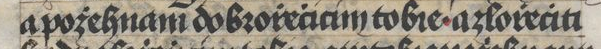a pożehnaní dobroṙeċícím tobie.a zloṙeċiti
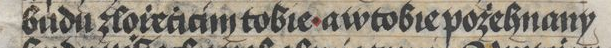budu zloṙeċicím tobie.a w tobie pożehnany
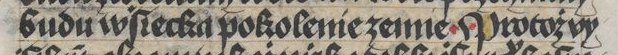budu wẛiecka pokolenie zemie.Protoż vy¬
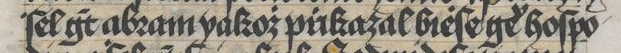ẛel ḡt abram yakoż pṙikażal bieẛe gev hoſpo¬
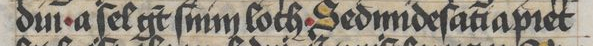dín.a ẛel ḡt ſním loch.Sedmideſati a piet
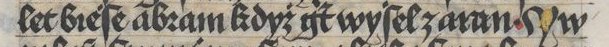let bíeẛe abram kdyż ḡt wyẛel zaran.Y w¬
